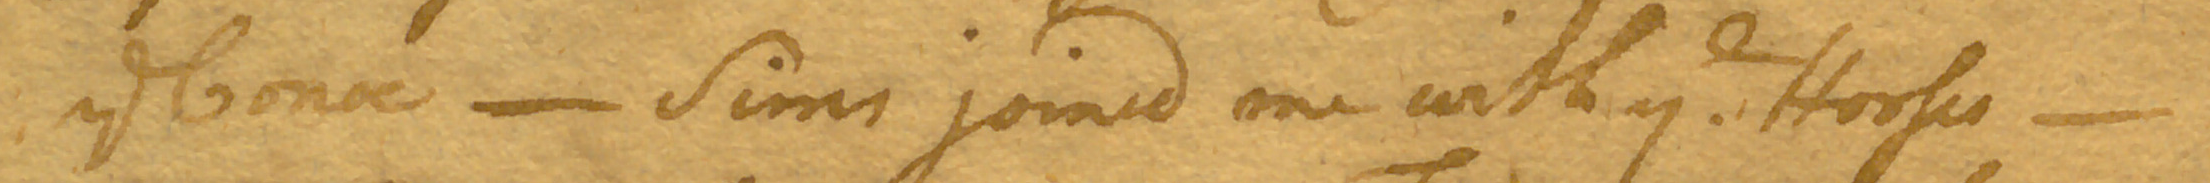y^e Conoe- Sims joined me with y^e. Horses-
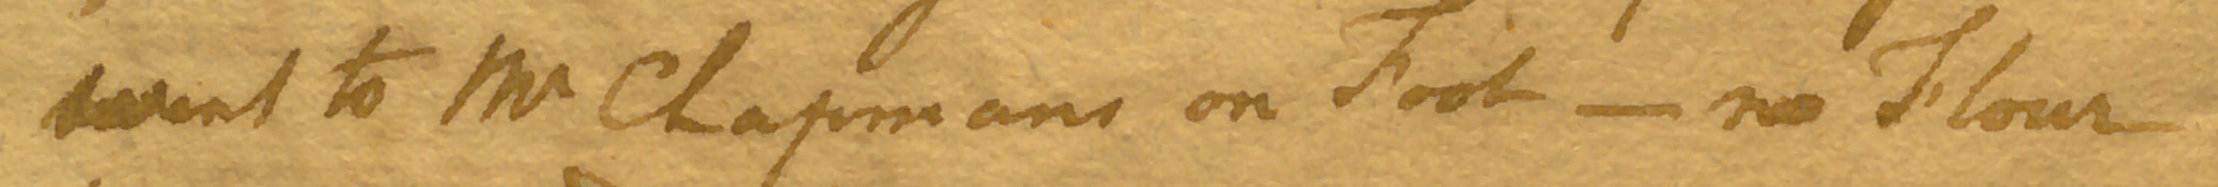went to M^r Chapmans on Foot- no Flour
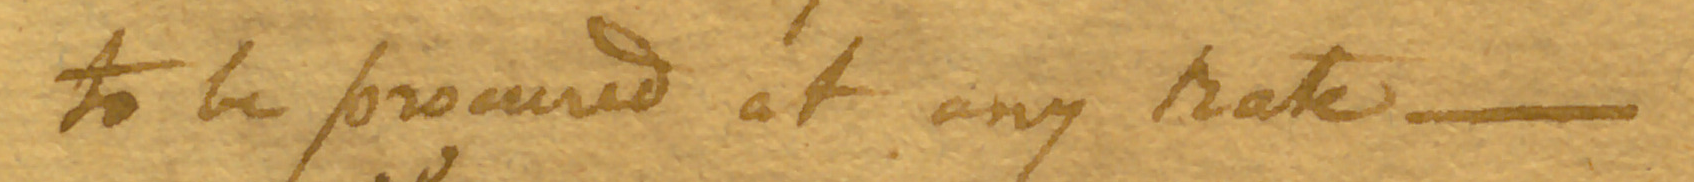to be procured at any rate-
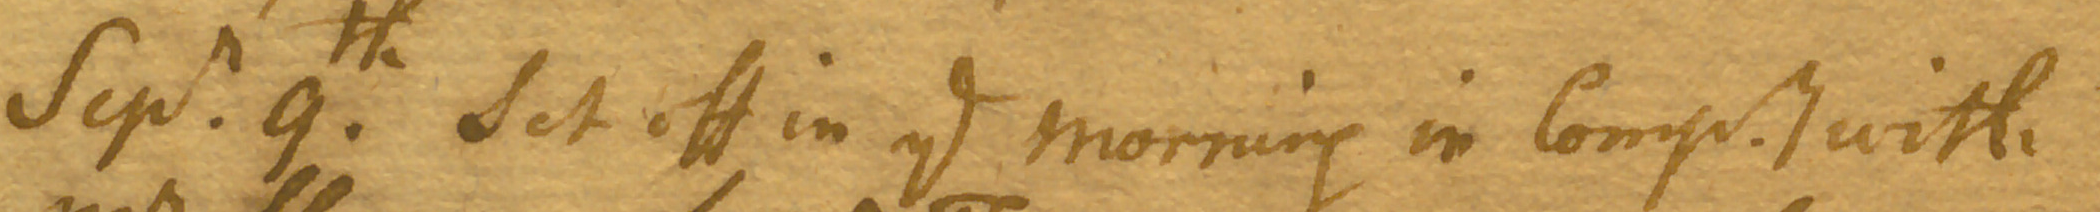Sep^r. 9^th. Set off in y^e morning in Comp.^y with
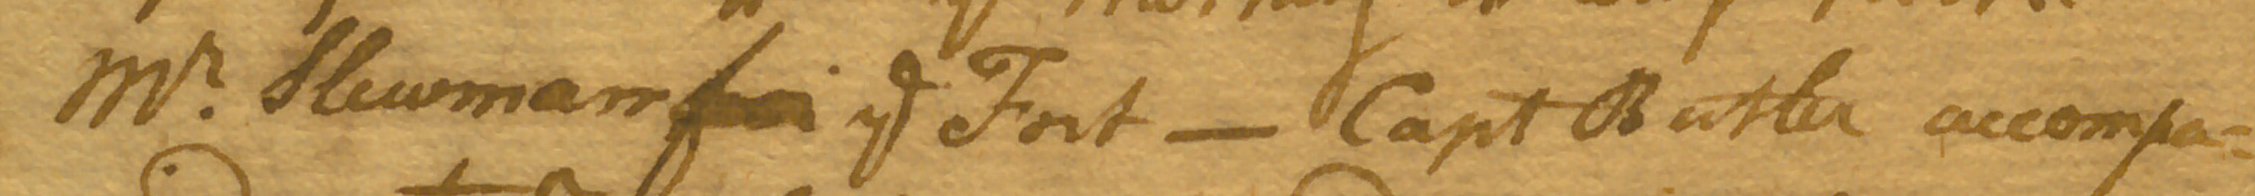M^r. Slewman for y^e Fort- Capt Butler accompa-
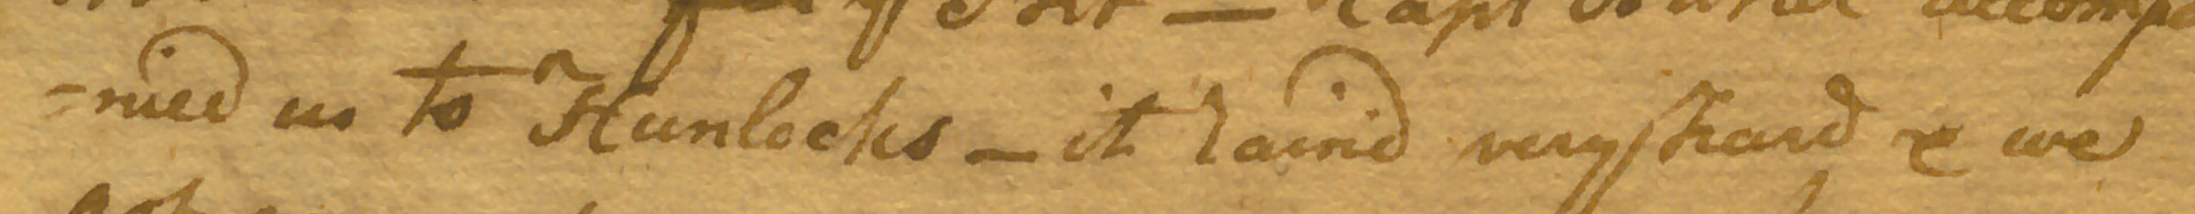-nied us to Hunlocks- it rain'd very hard & we
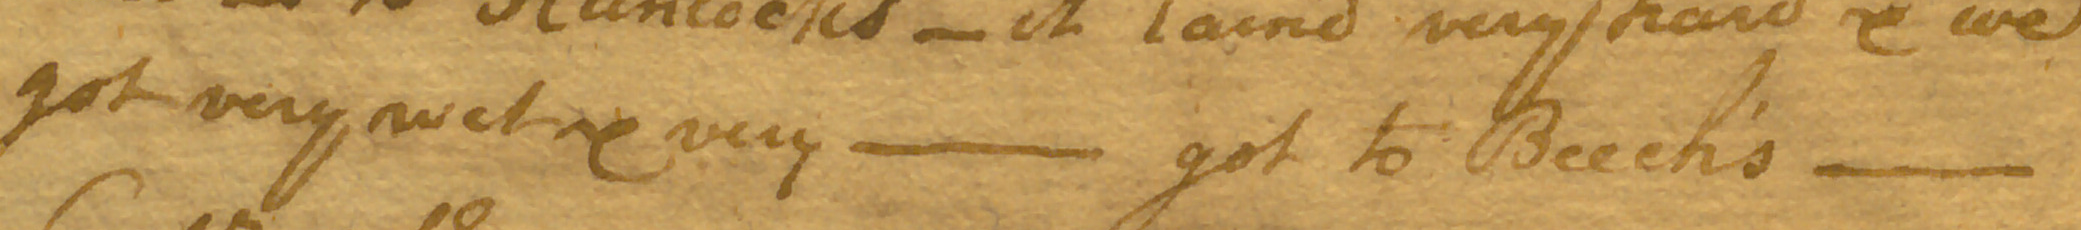got very wet & very- got to Beech's-
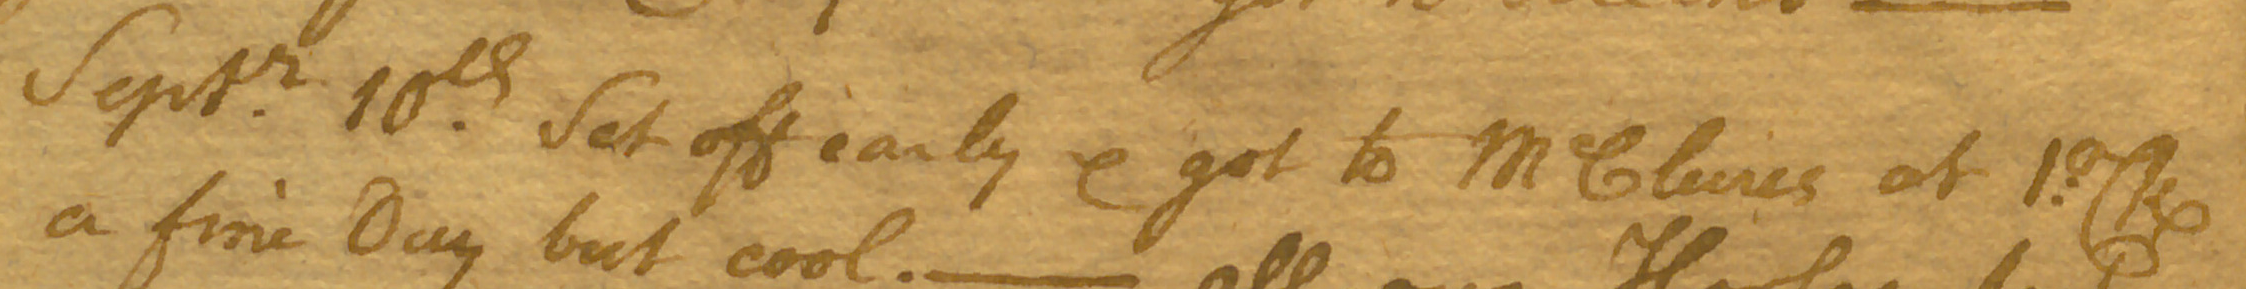Sept^r. 10^th. Set off early & got to M^cClures at 1: ^oCk
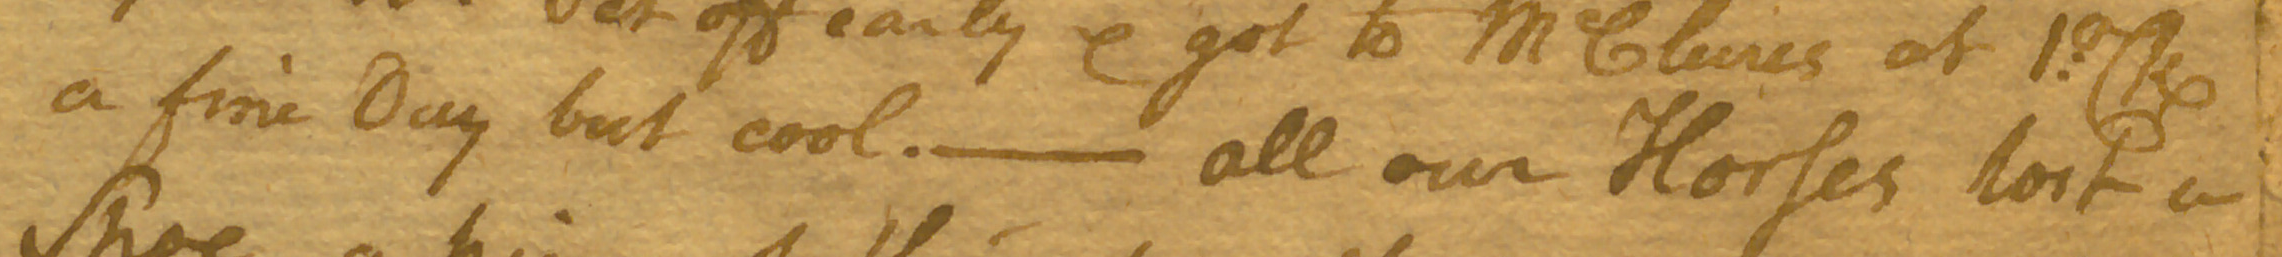a fine day but cool.- all our Horses lost a
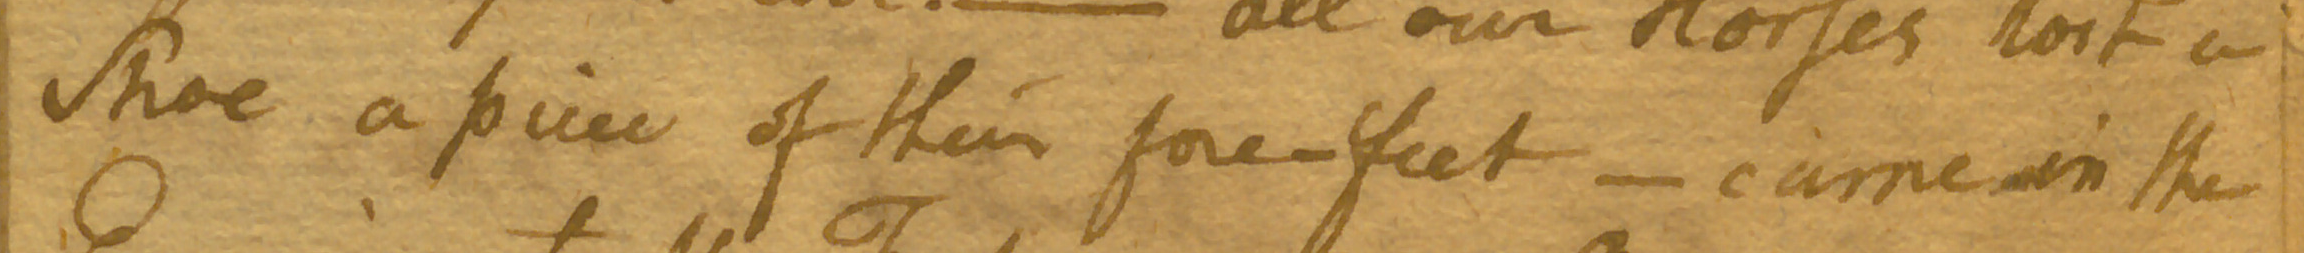Shoe a piece of their fore-feet- came in the
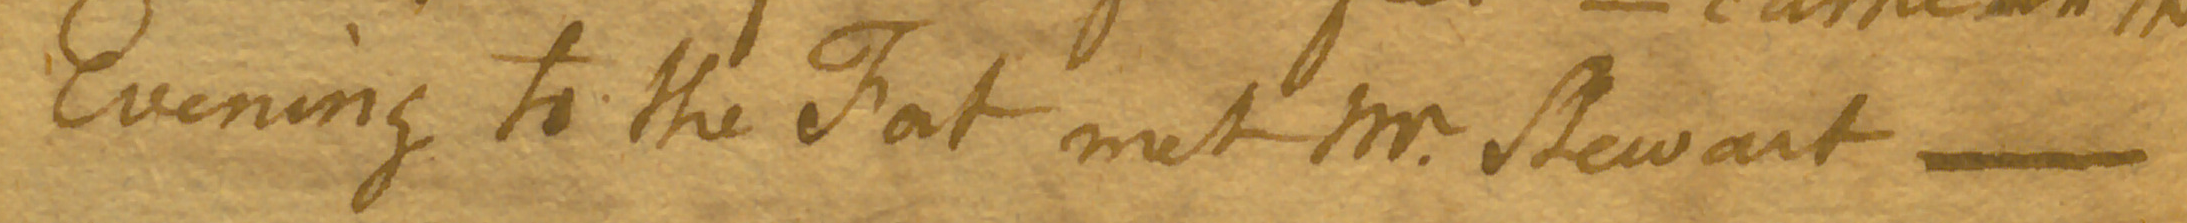Evening to the Fort met M^r. Stewart-
